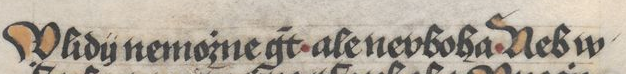U lidij nemożné ḡt. ale ne vboha. Neb w¬
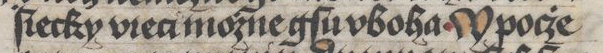ẛiecky vieci možne gſu vboha.Y pocże¬
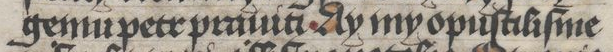gemu petr prauiti. Ay my opuſtili ſme
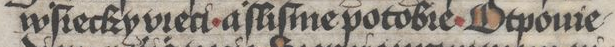wẛiecky vieci.a ẛli ſme potobie.Otpouie¬
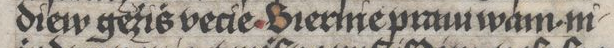diew geżiṡ vecie.Viernie praui wam ni¬
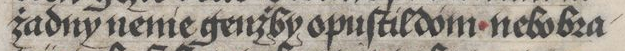żadny neníe genżby opuſtil dóm.nebo bra¬
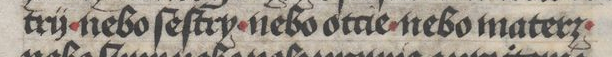try.nebo ſeſtry.nebo otcie.nebo materz.
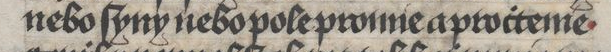nebo ſyny nebo pole pro mnie proċtenie.
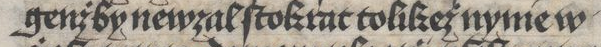genż by newzal ſtokrat tolikeż nyníe w¬
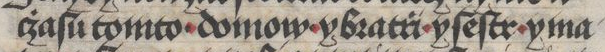cżaſu tomto.domow.y bratṙi.y ſeſtr.y ma¬
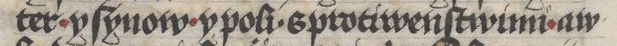ter.y ſynow.y polí.s protiwenſtwími.a w
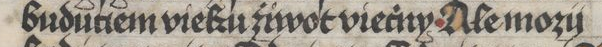buduciem vieku żiwot vieċny.Ale mozij
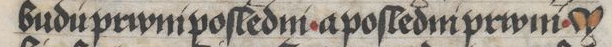budú prwní poſlední.a poſlední prwní.Y
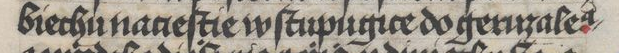biechu na cieſtie wſtupugice do geruzalea
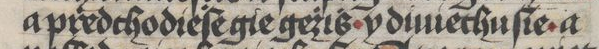a pṙedchodíeẛe gie geżíṡ.y diuíechu ſie.a
